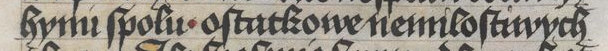hynú ſpolu.oſtatkowe nemiloſtiwych
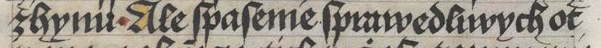zhynu.Ale ſpaſeníe ſprawedliwych ot
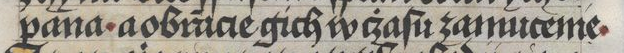pana.a obracie gich w cżaſu zamuceníe.
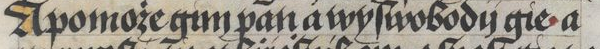Apomoże gim pan a wyſwobodij gie.a
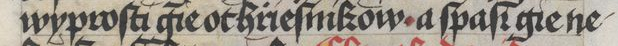wyproſtí gie ot hṙíeẛníkow.a ſpaſi gie ne¬
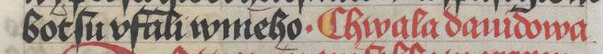botſu vfali wmeho.Chwala dauidowa
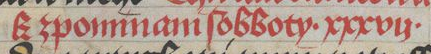k zpomínaní ſobboty.xxxvij.
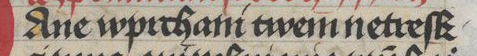Ane wprchaní twem netreſk¬
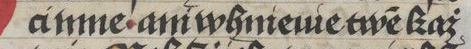ci mne.ani whnieuie twē każ¬
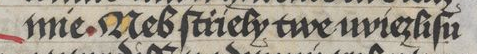mie.Neb ſtṙiely twe uvíezliſu
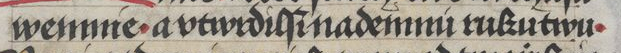wemnie.a vtwrdilſi nademnú ruku twu.
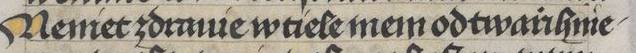Neníet zdrauíe w tiele mem od twaṙi hnie¬
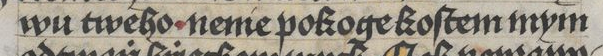wu tweho.neníe pokoge koſtem mym
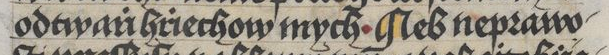odtwaṙi hṙiechow mych.Neb neprawo¬
